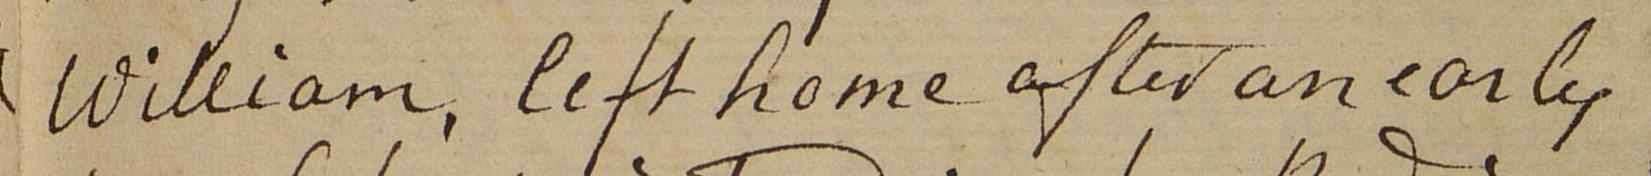William, left home after an early
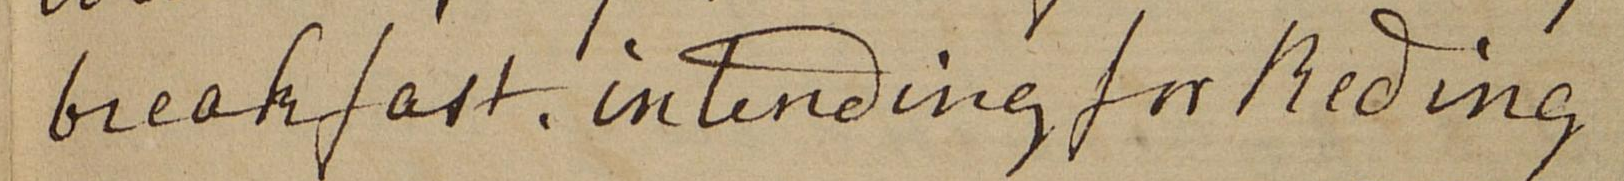breakfast, intending for Reding
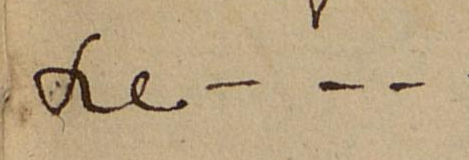&c---
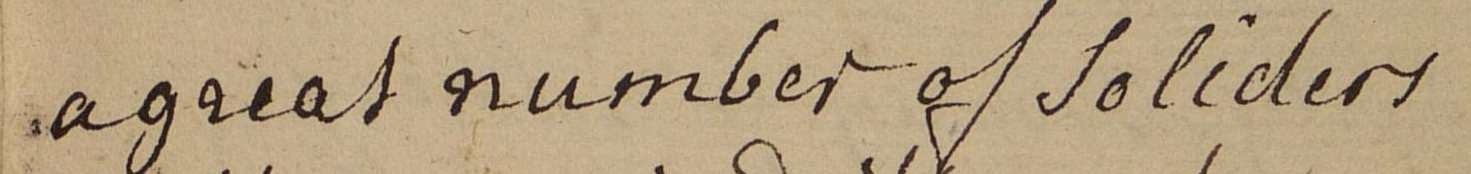a great number of Soliders
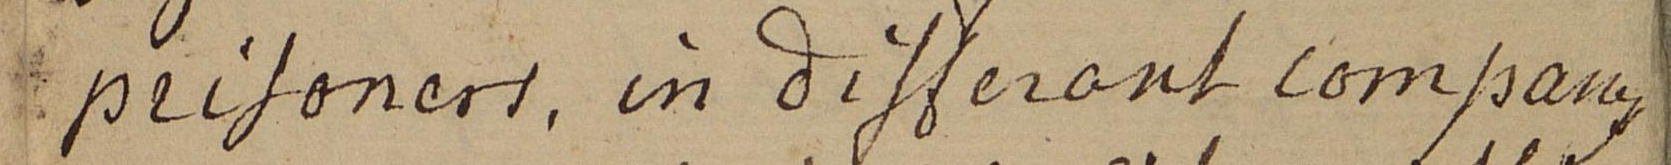prisoners, in differant company
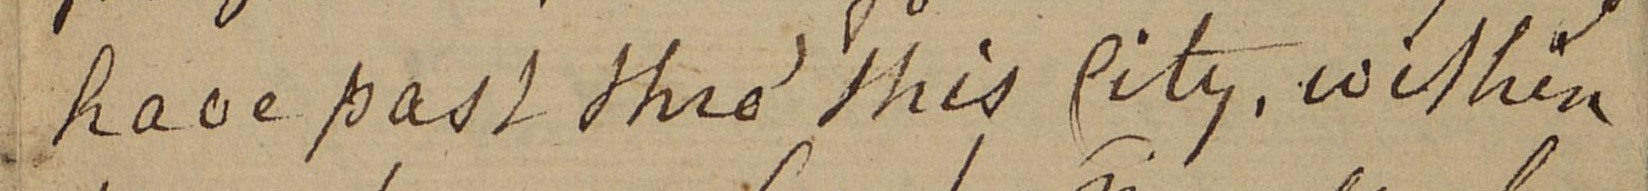have past thro' this City, within
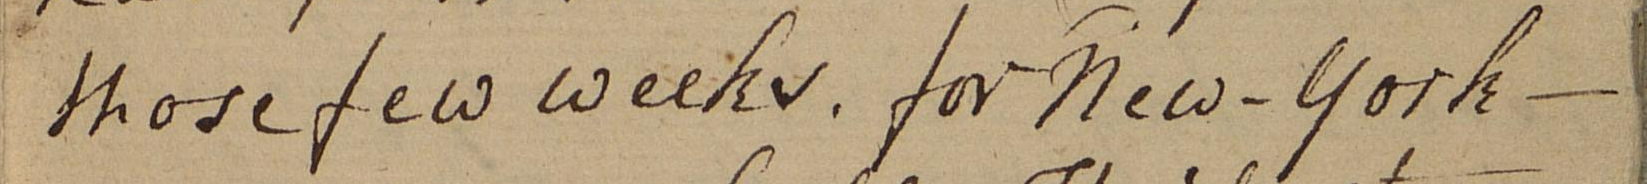those few weeks. for New-York-
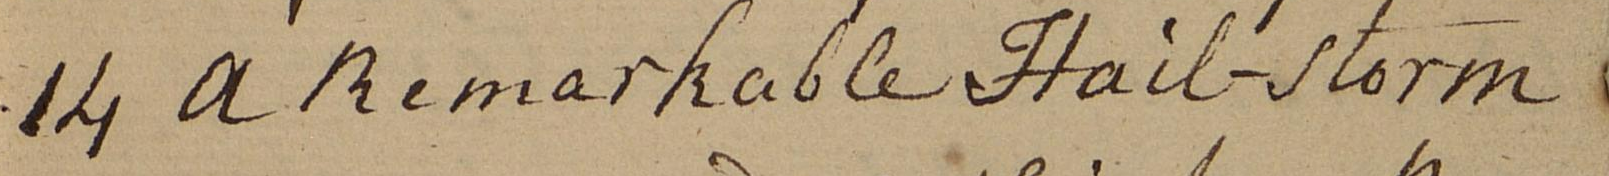14 A Remarkable Hail-storm
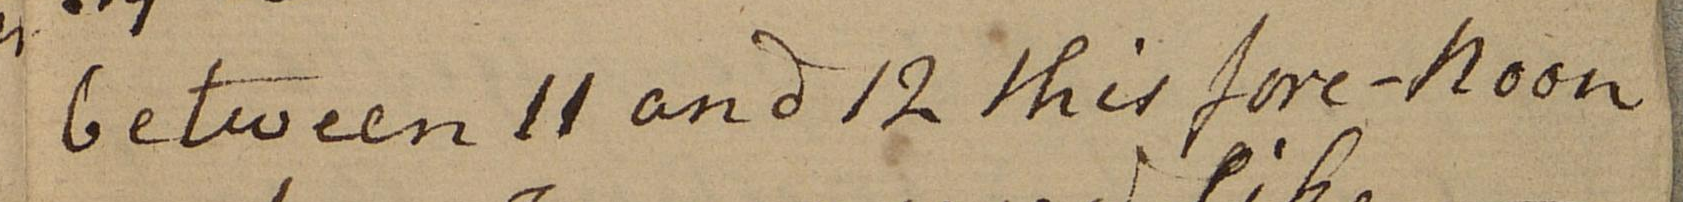between 11 and 12 this fore-Noon
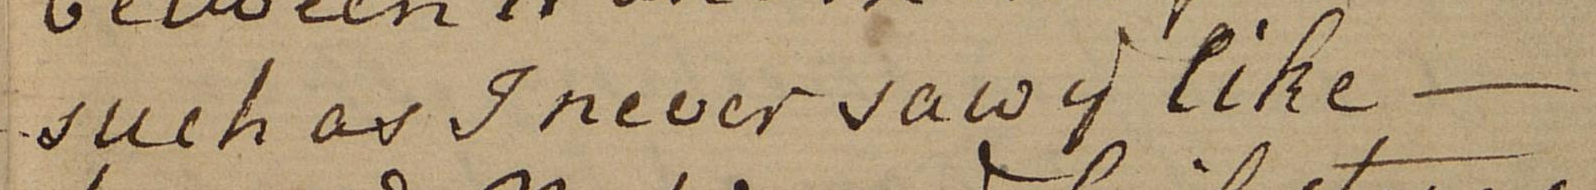such as I never saw y^e like-
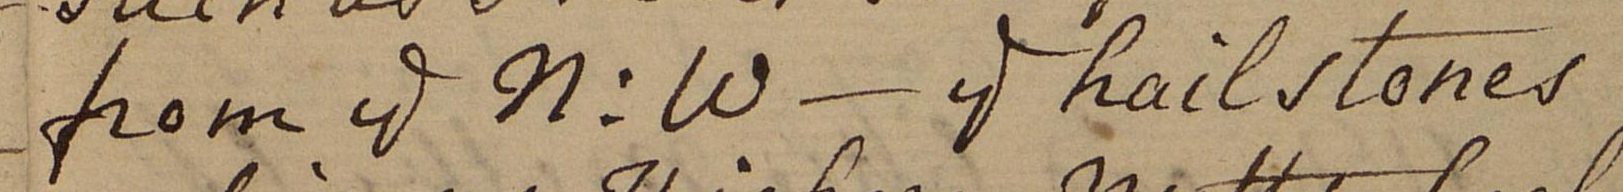from y^e N:W- y^e hail stones
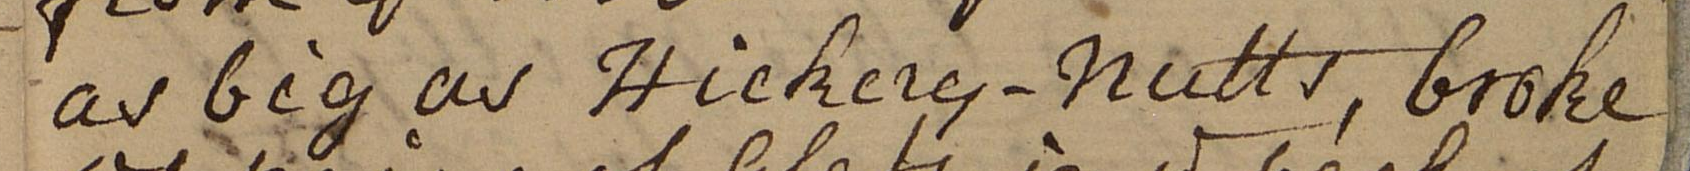as big as Hickery-Nutts, broke
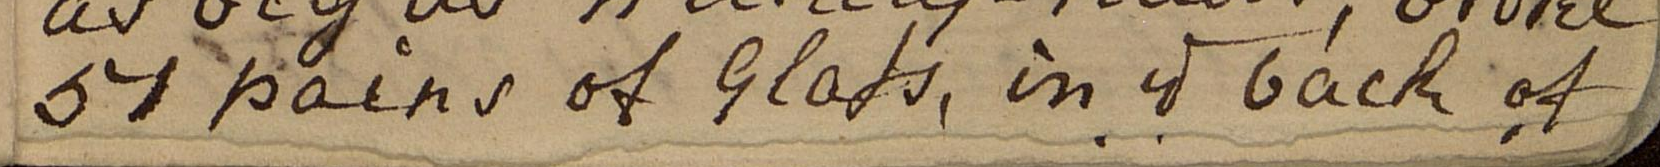57 pains of Glass, in y^e back of
